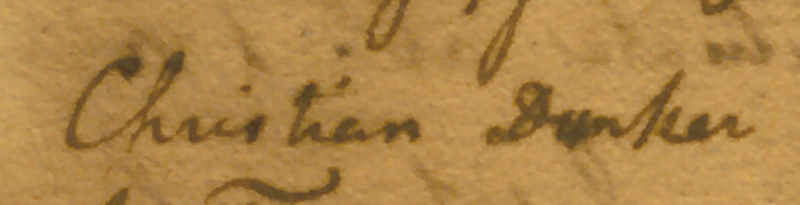Christian Dunker
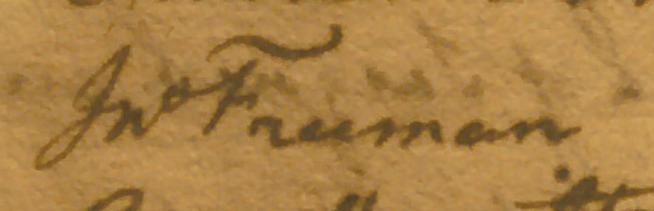Jn^o Freeman
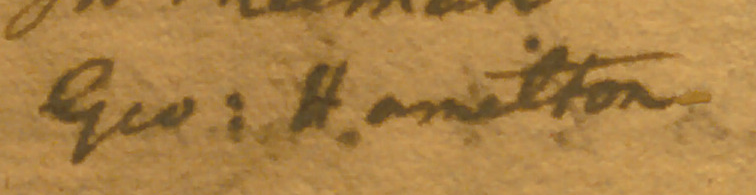Geo: Hamilton
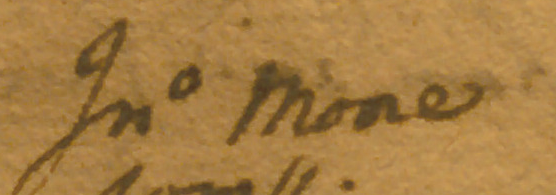Jn^o Moore
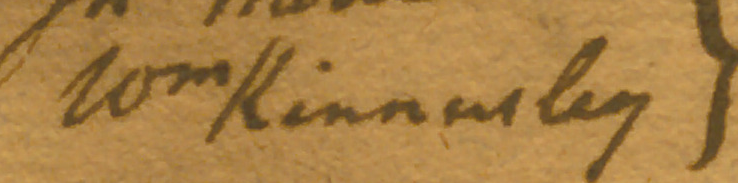W^m Kinnersley
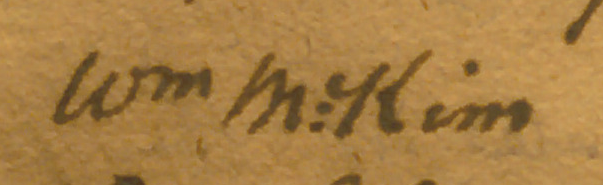W^m M:Kim
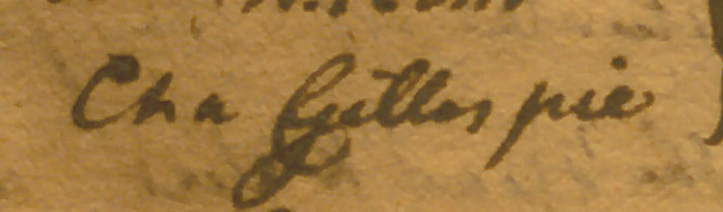Cha Gillespie
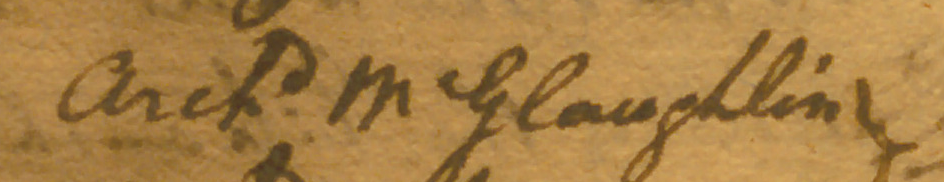Arch^d M^cGlaughlin
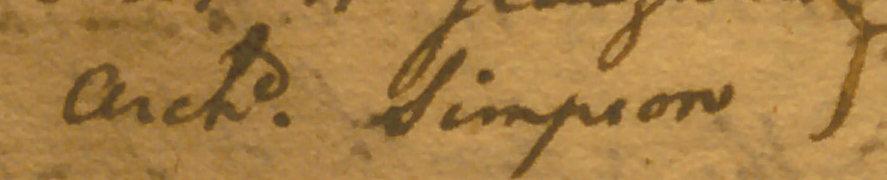Arch^d Simpson
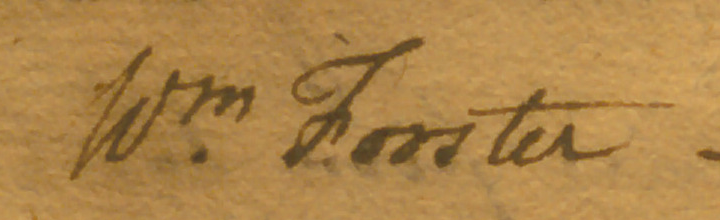W^m. Forster
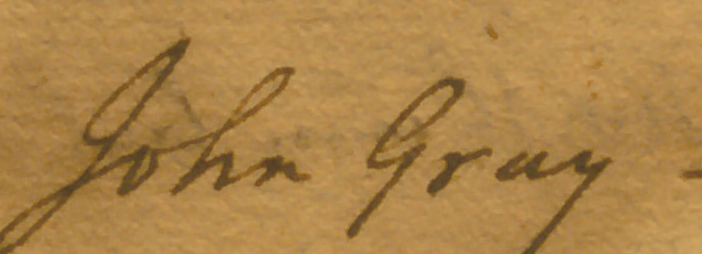John Gray
